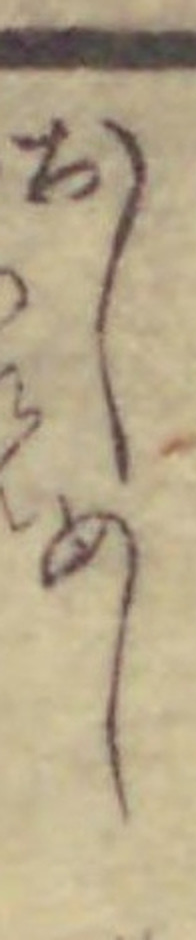おしめし
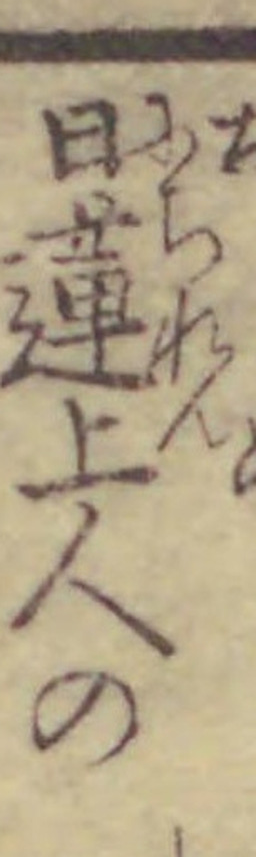日蓮上人の
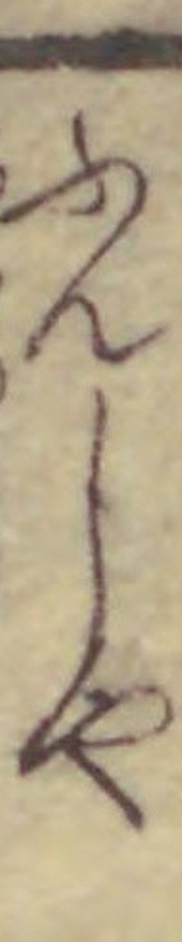ふんしや
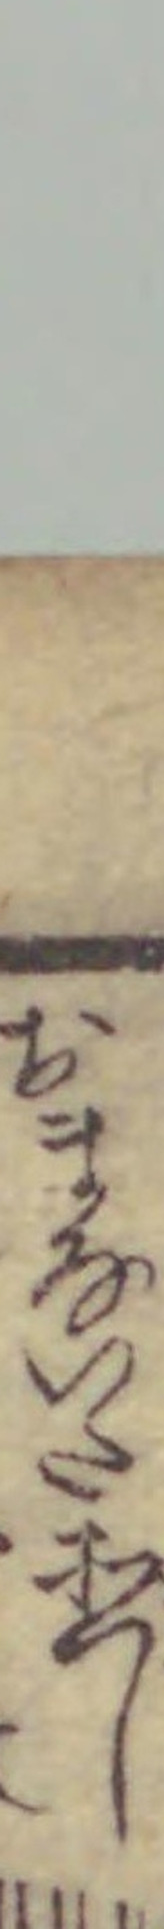おまないた直し
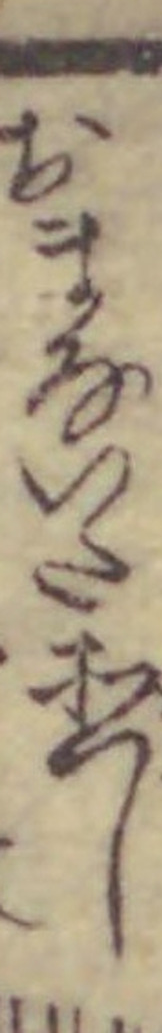おまないた直し
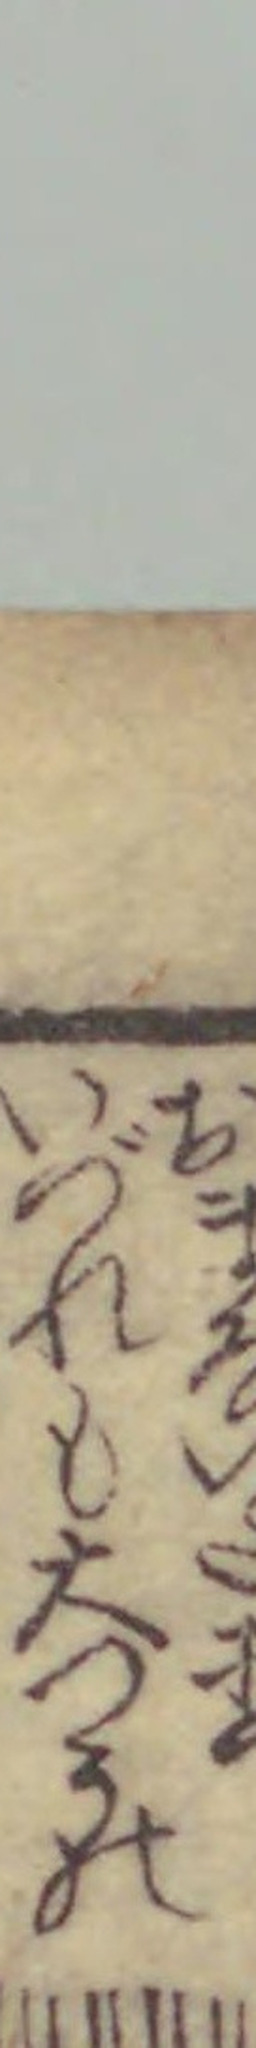いづれも大つうの
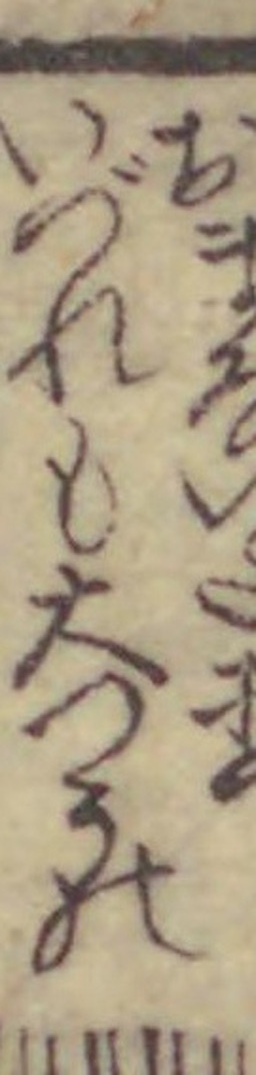いづれも大つうの
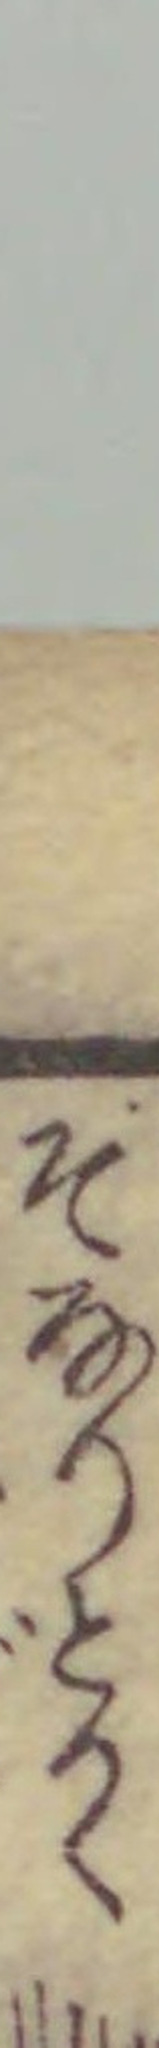そなりとかく
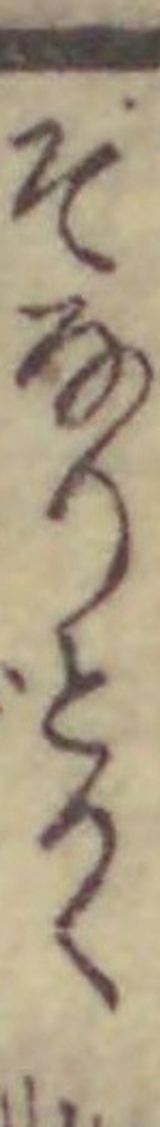そなりとかく
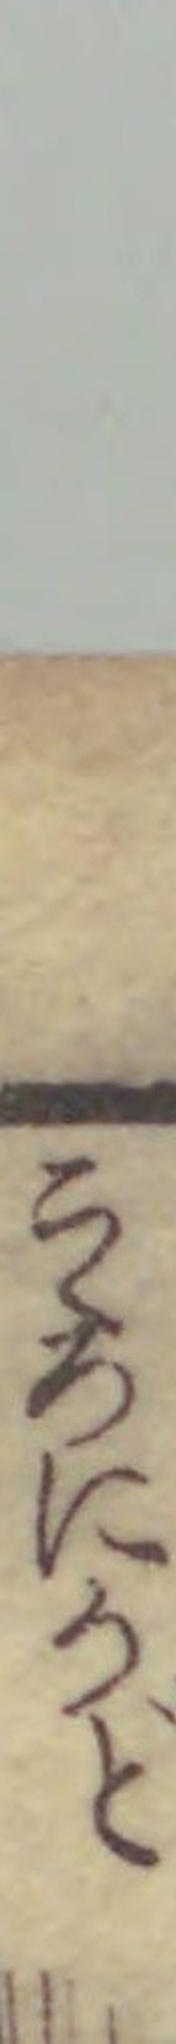こゝろにかど
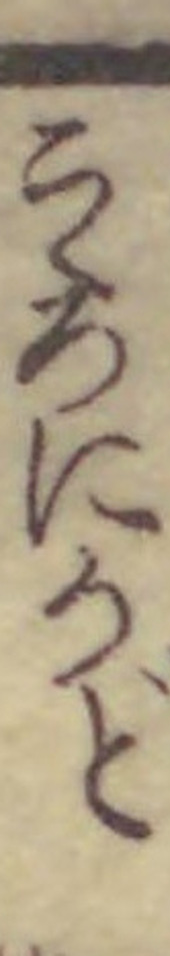こゝろにかど
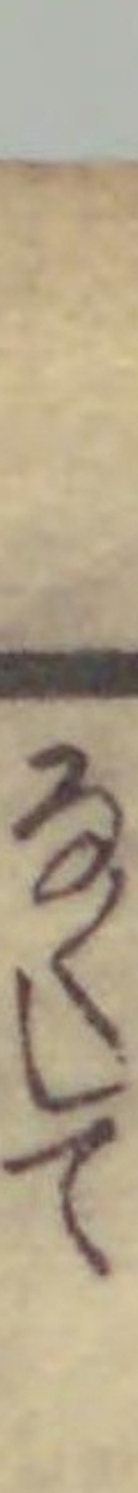なくして
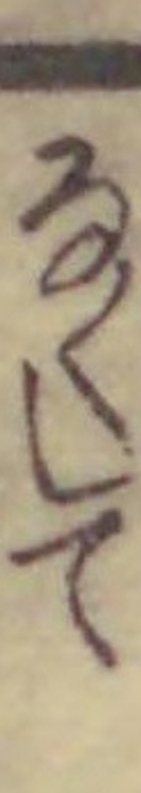なくして
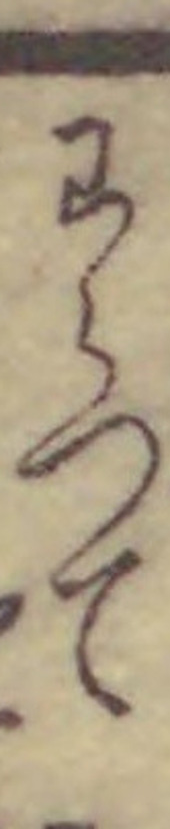わらつて
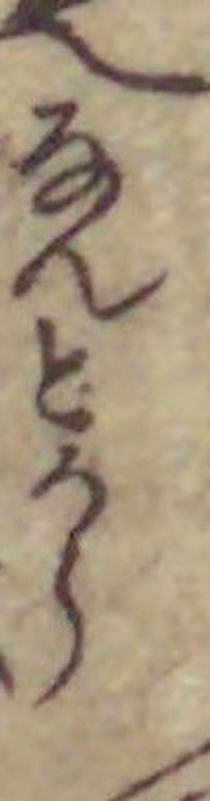なんとから
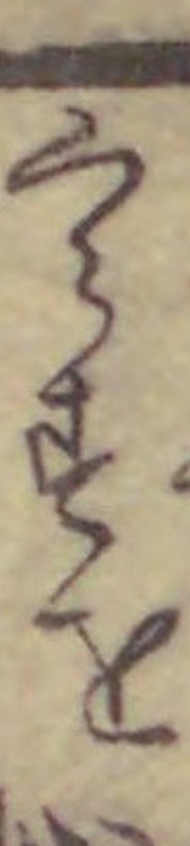くらすを
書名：大通人穴[サガシ] 3巻
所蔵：国立国会図書館 National Diet Library, JAPAN
